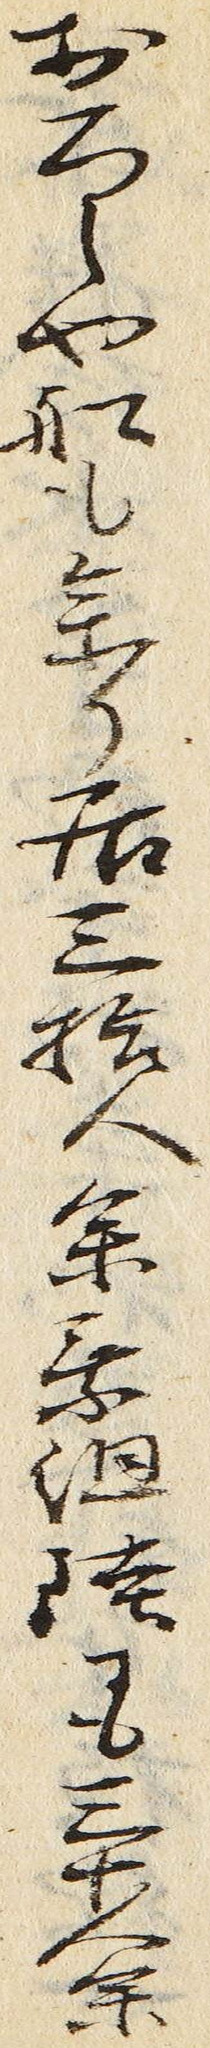おろしや船も参り居三拾人余乗組陸にも三十人余
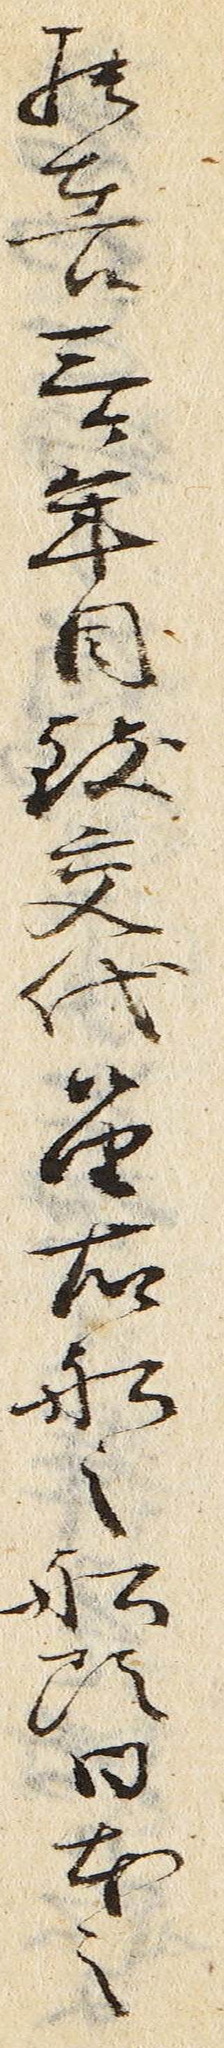罷在候三ヶ年目致交代候由右船之船頭日本之
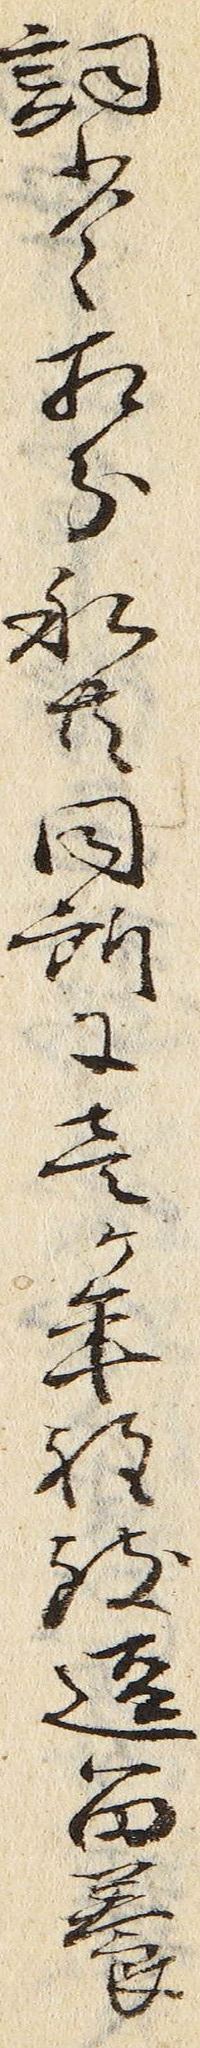詞少々相分私共同所に壱ヶ年程致逗留養
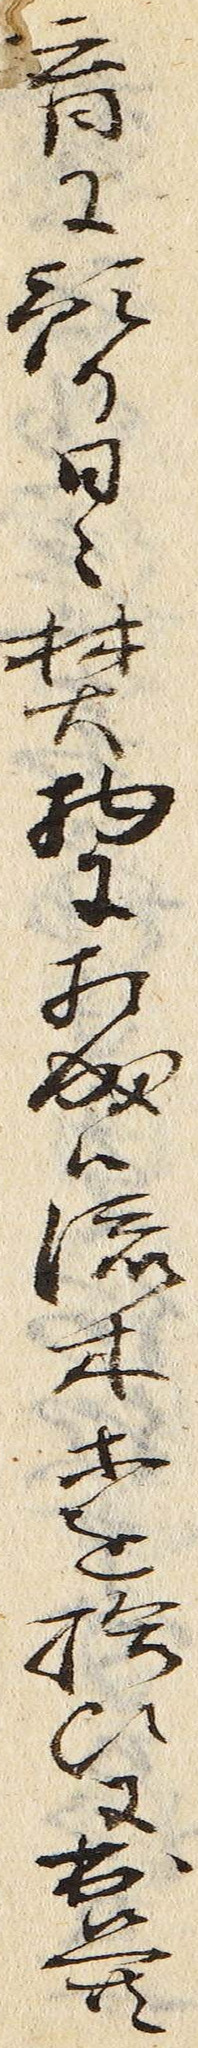育に預り日々焚物に相成候流木等を拾ひに出候へ共
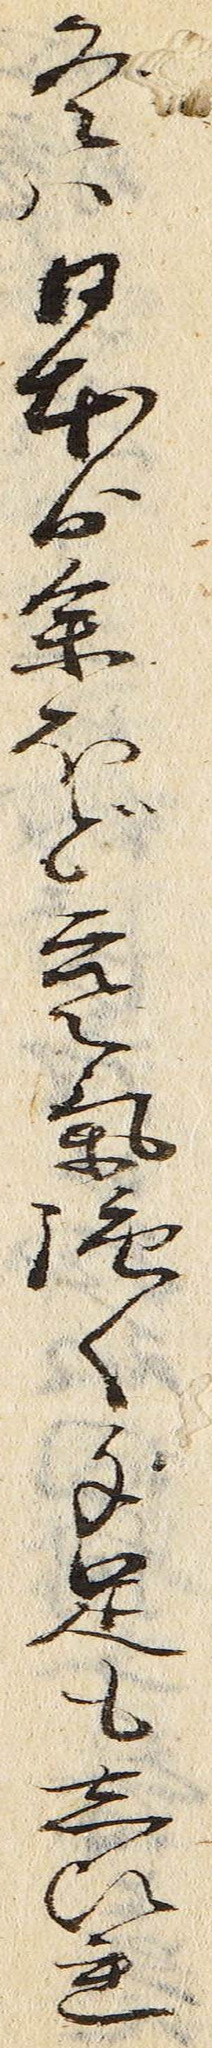冬は日本ゟ余ほど寒気強く手足もしひれ
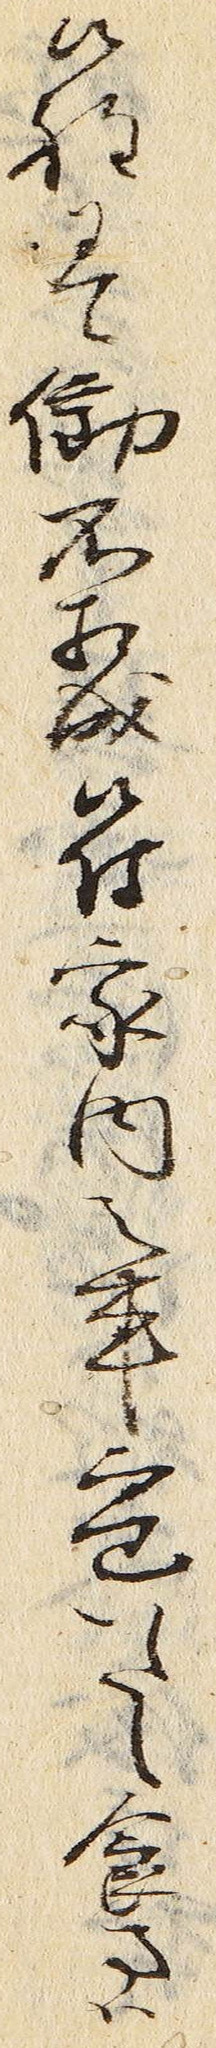候程にて働不相成候付家内之事而已いたし食事は
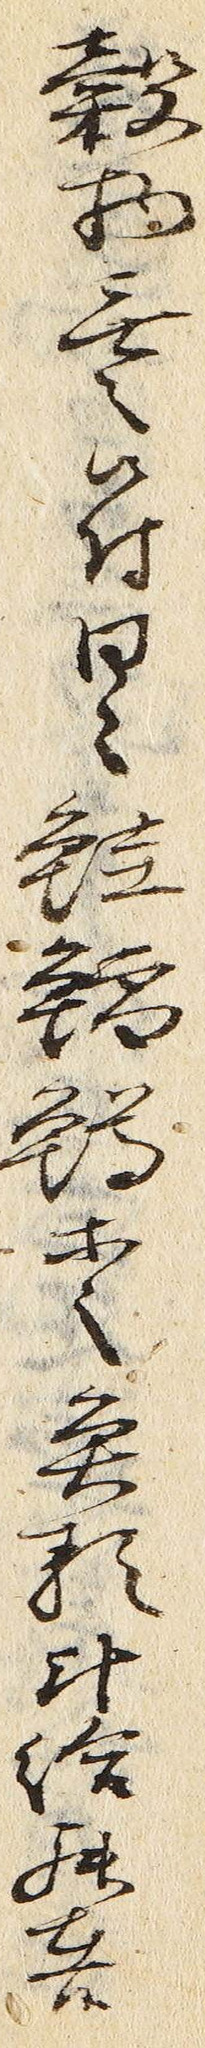穀物無之候付日々鮭鱈鱒等之魚類斗給罷在候
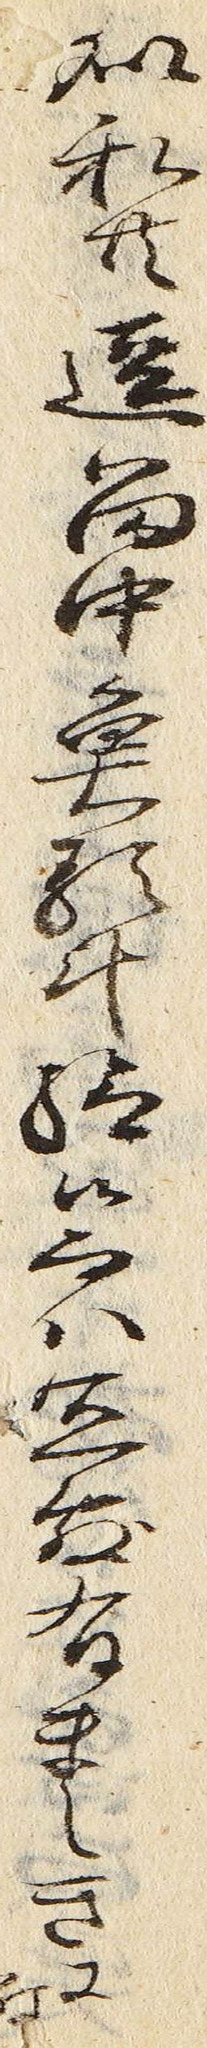処私共逗留中魚類斗給候ては宜敷有ましきに付
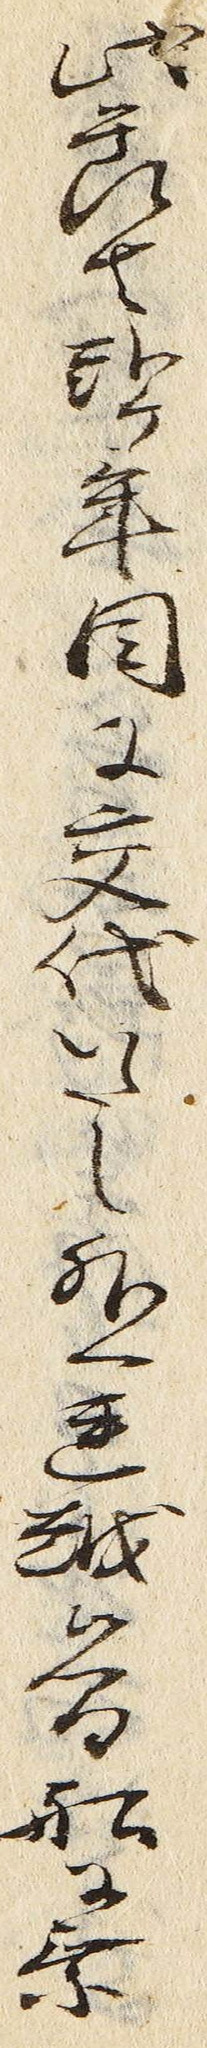此節は弐ヶ年目に交代いたし外へ連越候間船に乗
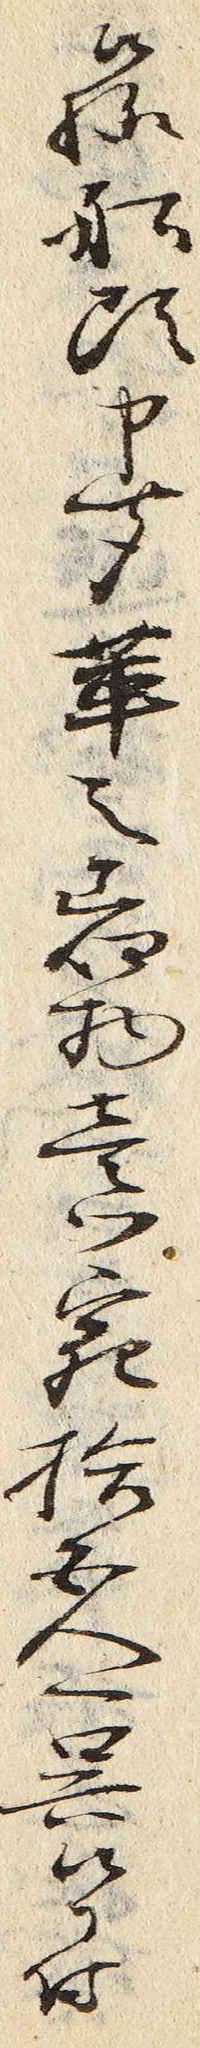候様船頭申聞革之着物壱ッ宛拾五人へ呉候に付
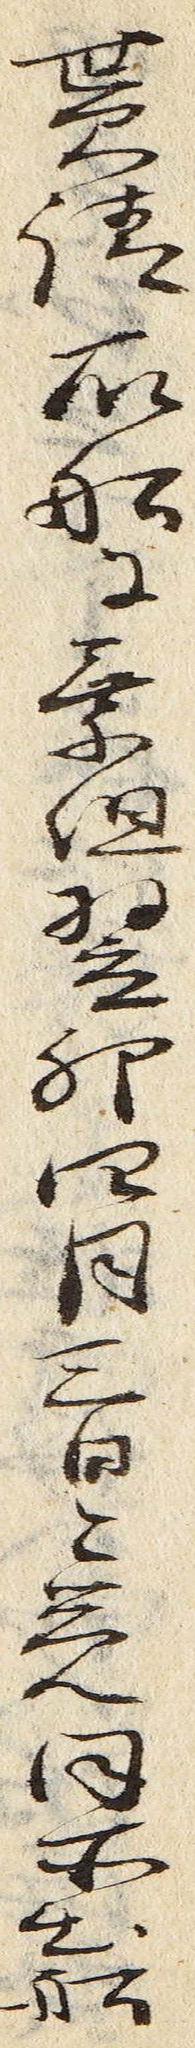貰請右船に乗組翌卯四月三日と覚同所出船
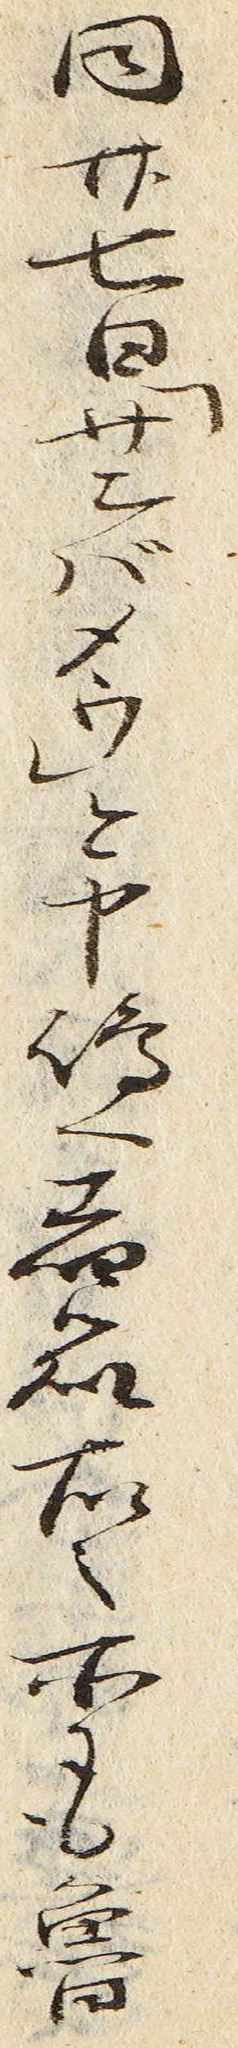同廿七日「サンバメウ」と申島へ着候処右之所にも魯
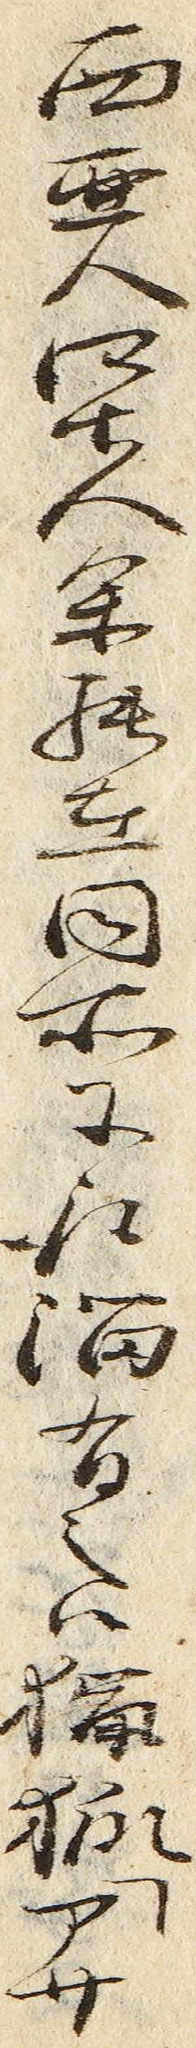西亜人四十人余罷在同所に取溜有之候猟狐「アサ
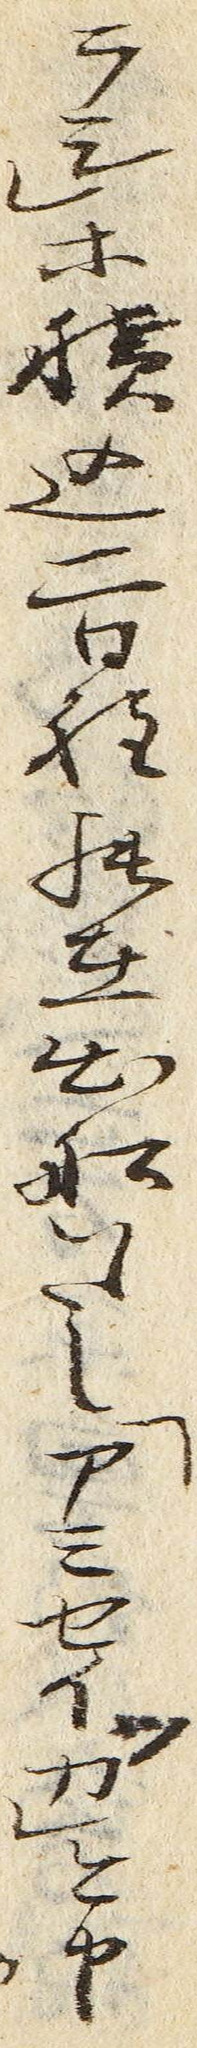ラシ」等積込二日程罷在出船いたし「アミセイツカ」と申
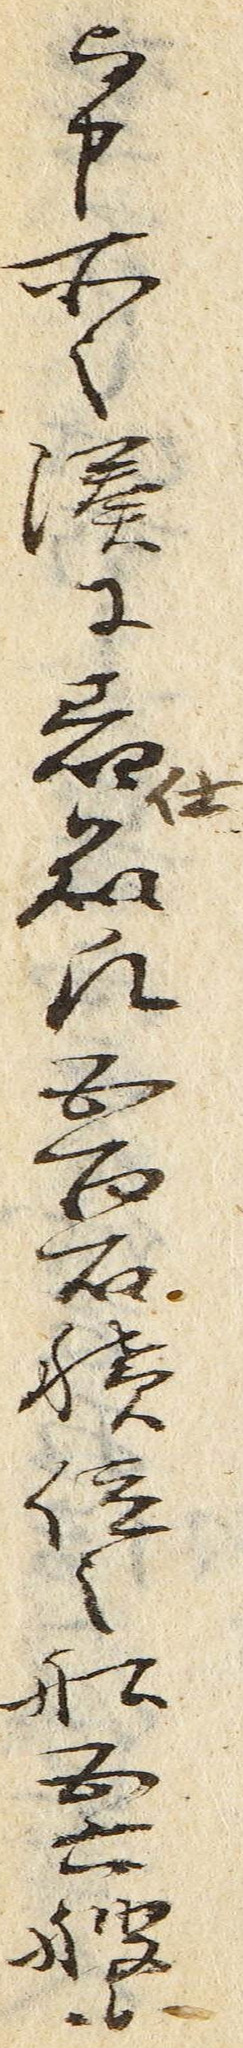と申所之湊に着仕候処凡五百石積位之船五六艘も

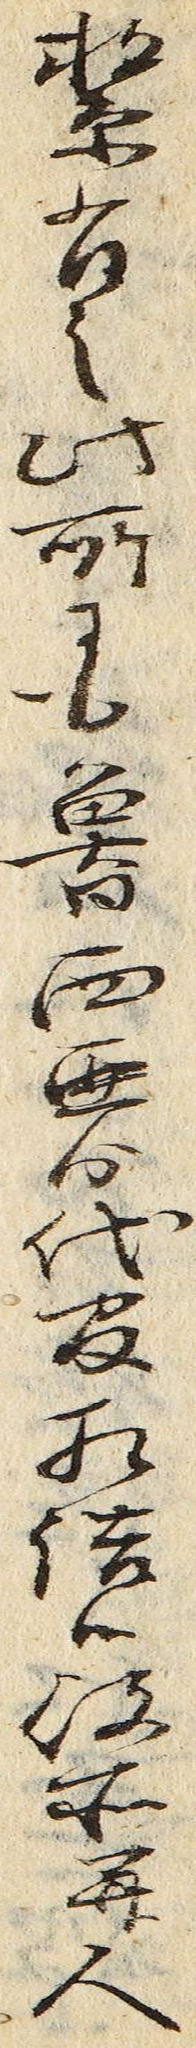繋有之此所にも魯西亜ゟ代官相詰候役所并人
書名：漂民後記
